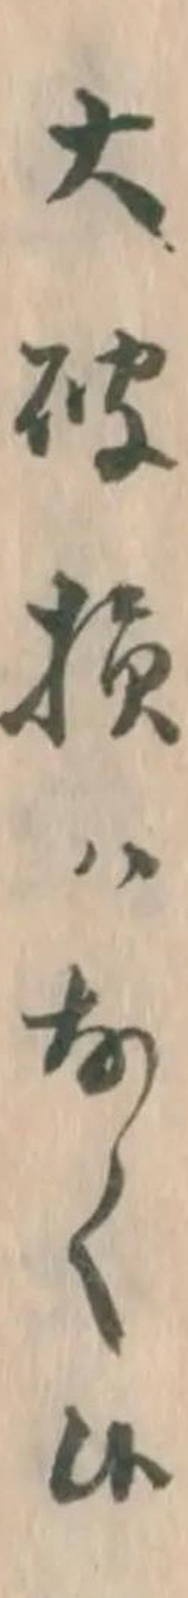大破損ハなく候

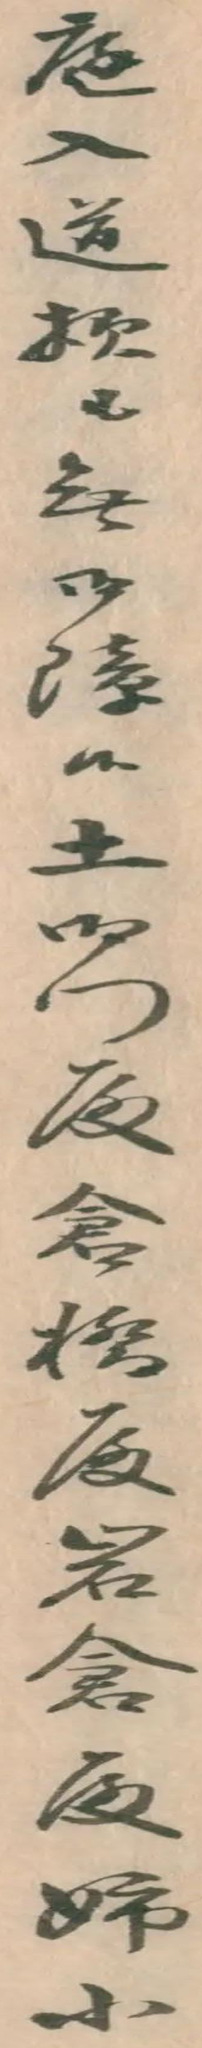庭入道様も無御障候土御門殿倉橋殿岩倉殿姉小
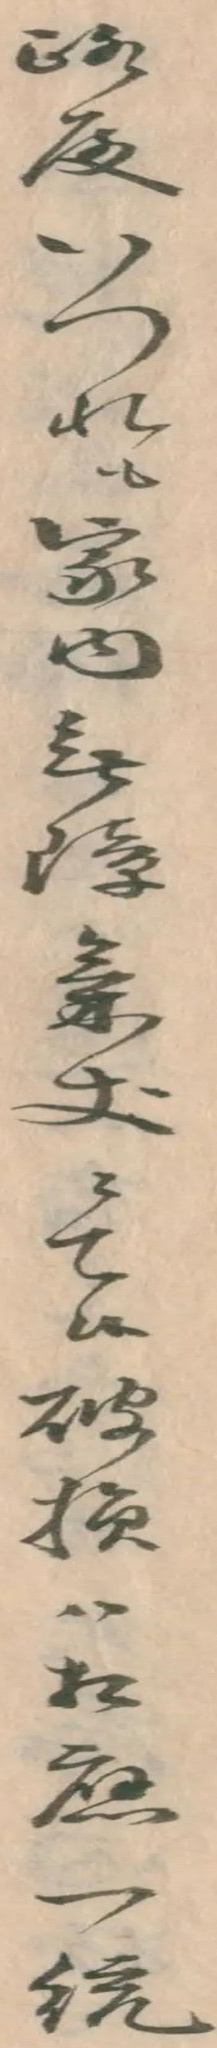路殿いつれも家内無障気丈二て候破損ハ相応一統
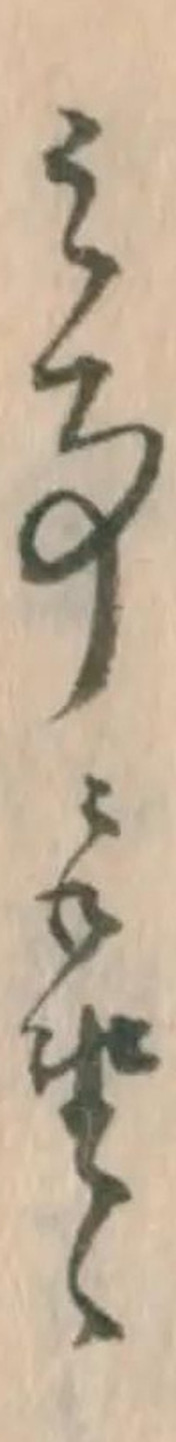之事二御座候
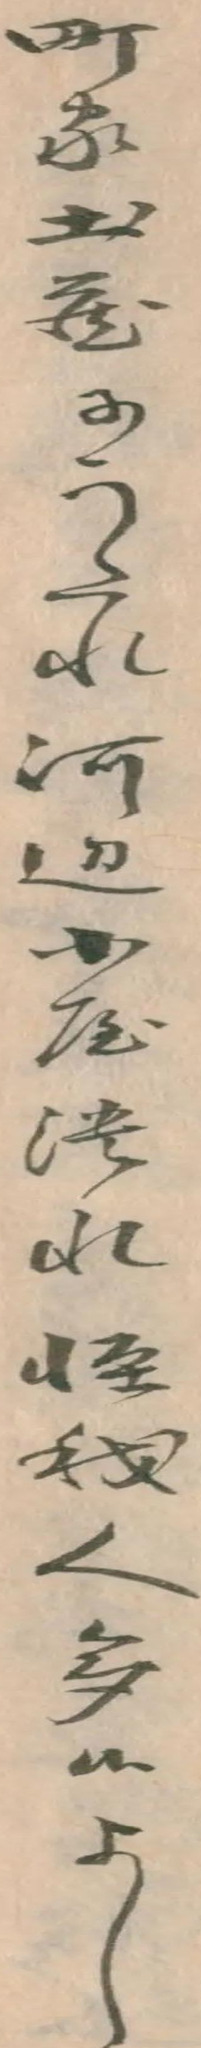町家土蔵にうたれ河辺小屋潰れ怪我人多候よし
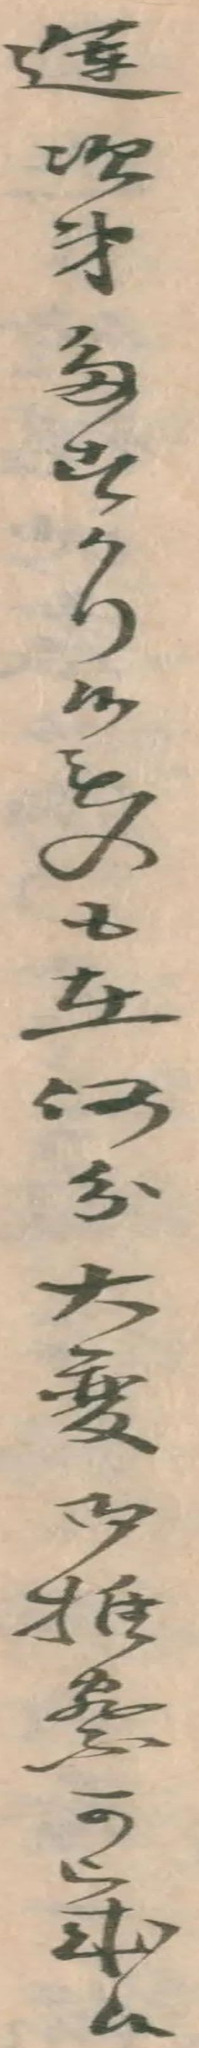運次第たすかり候ものも在何分大変御推察可被成候
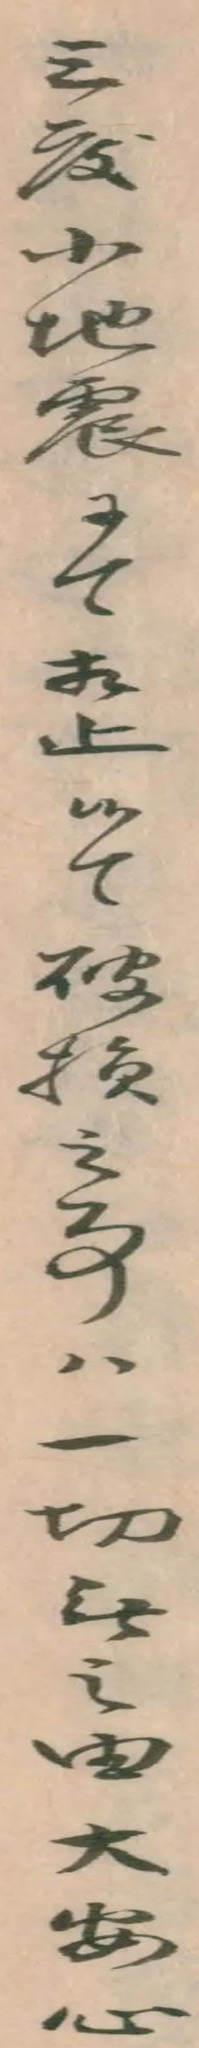三度小地震にて相止候て破損の事ハ一切無之由大安心
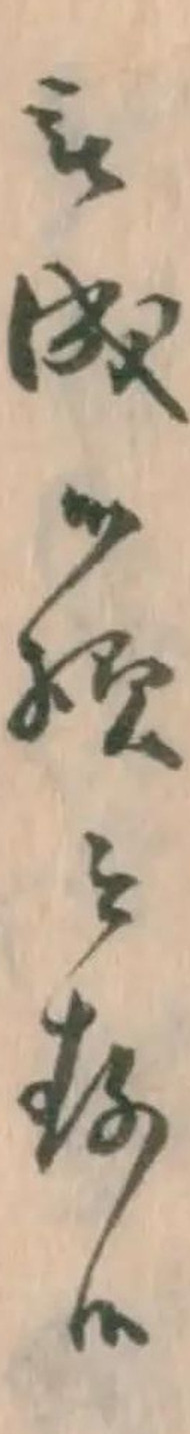被成候様と存候
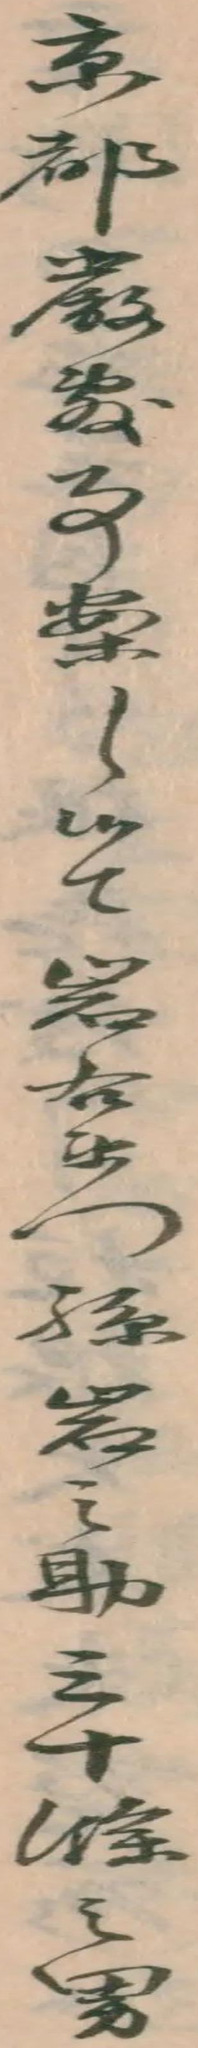京都厳敷事案し候て岩右衛門孫岩之助三十余之男
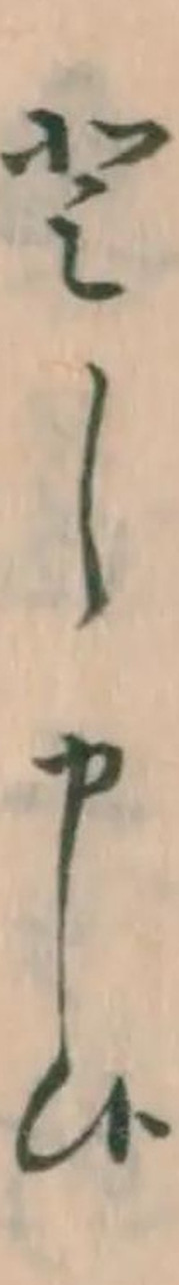登し申候
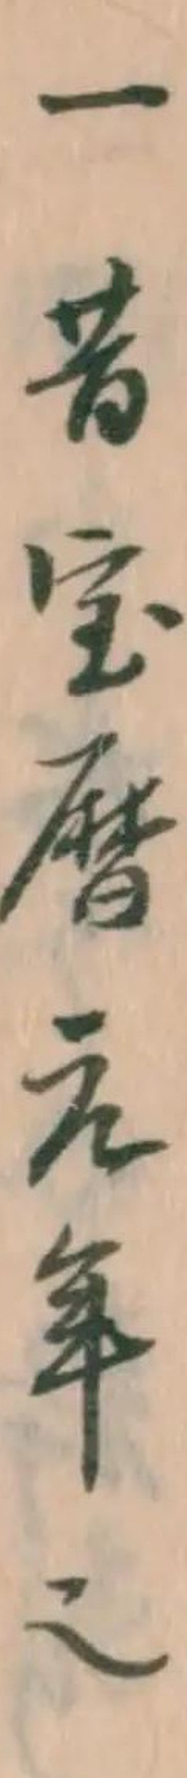一昔宝暦元年也
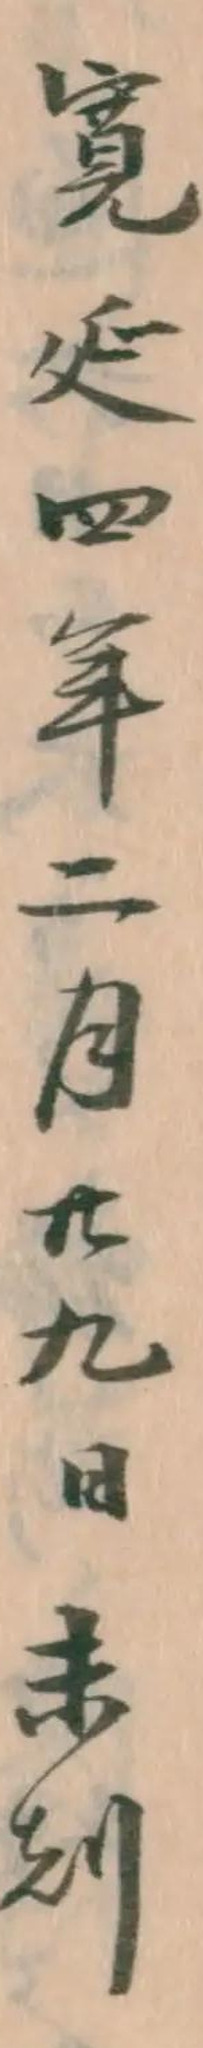寛延四年二月廿九日未刻
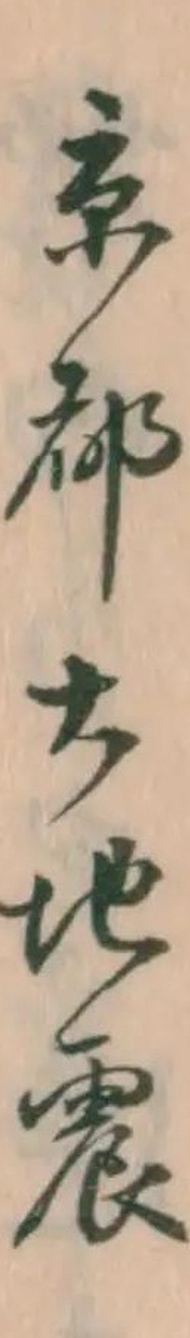京都大地震
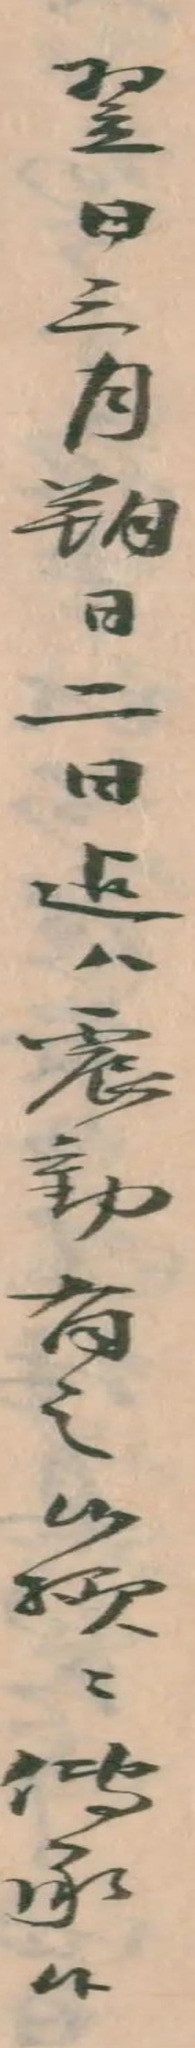翌日三月朔日二日迄ハ震動有之候様二伝承候
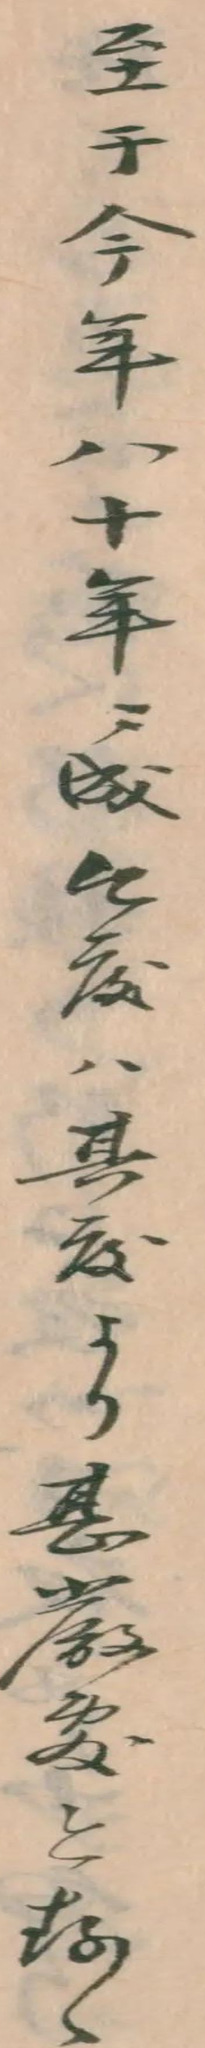至干今年ハ十年二成今度ハ其度より甚厳敷と存候
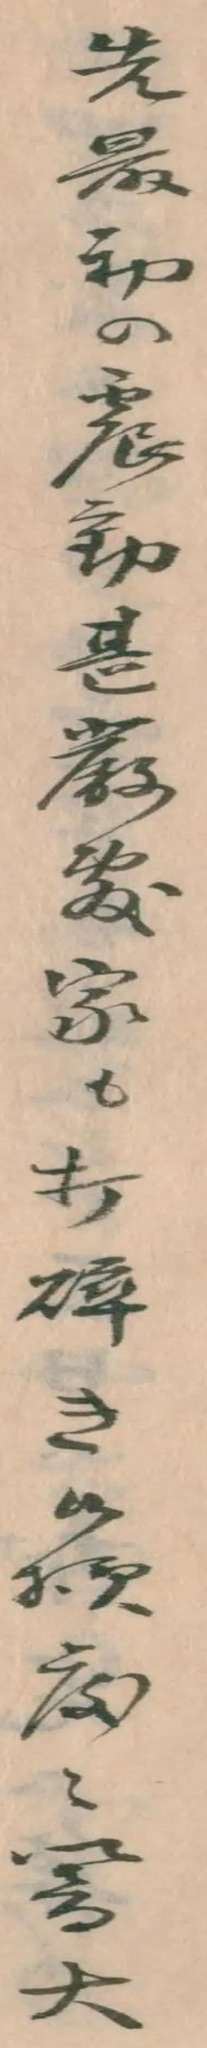先最初の震動甚厳敷家も打砕き候様度々響大
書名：京都地震
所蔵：国立国会図書館 National Diet Library, JAPAN
